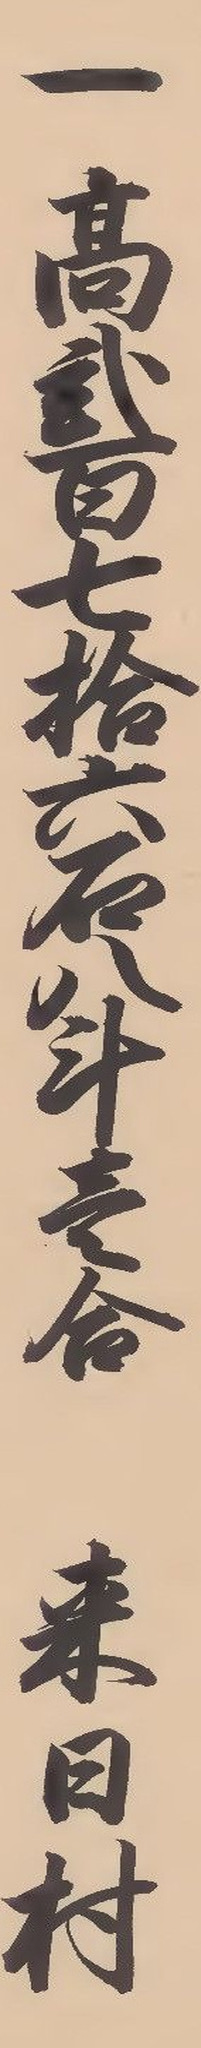一高弐百七拾六石八斗壱合来日村
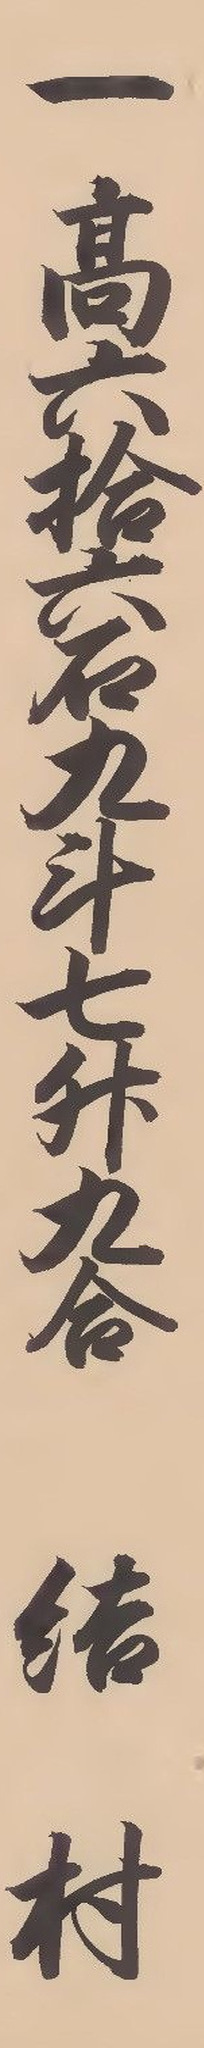一高六拾六石九斗七升九合結村
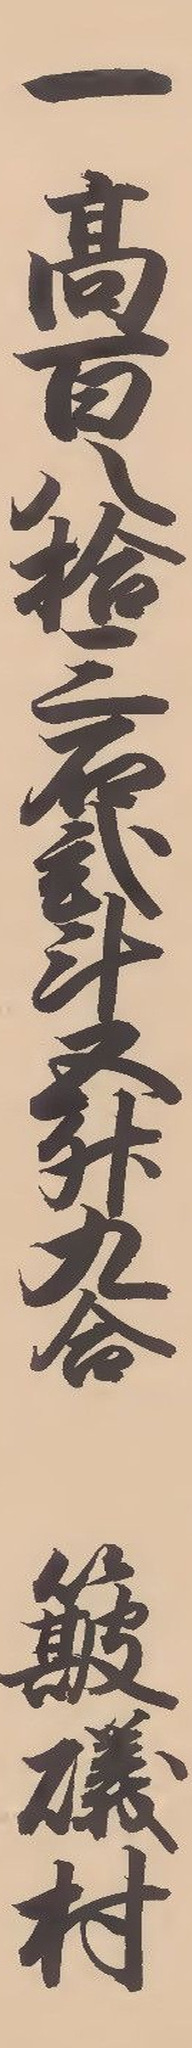一高百八拾三石弐斗五升九合簸磯村
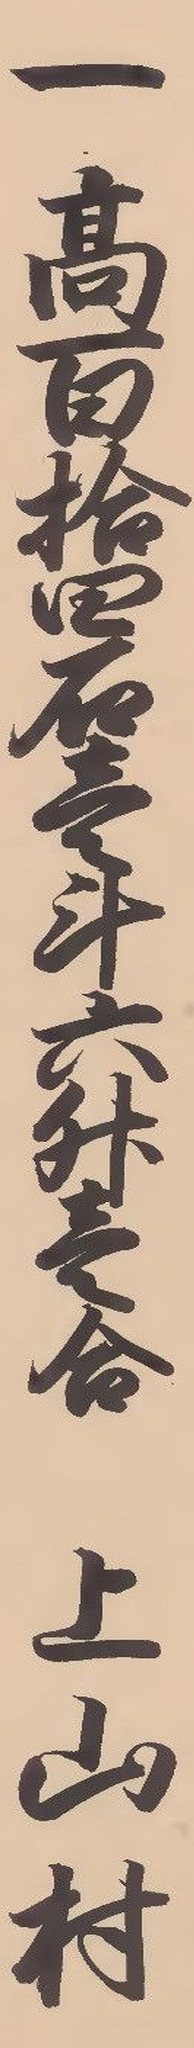一高百拾四石壱斗六升壱合上山村
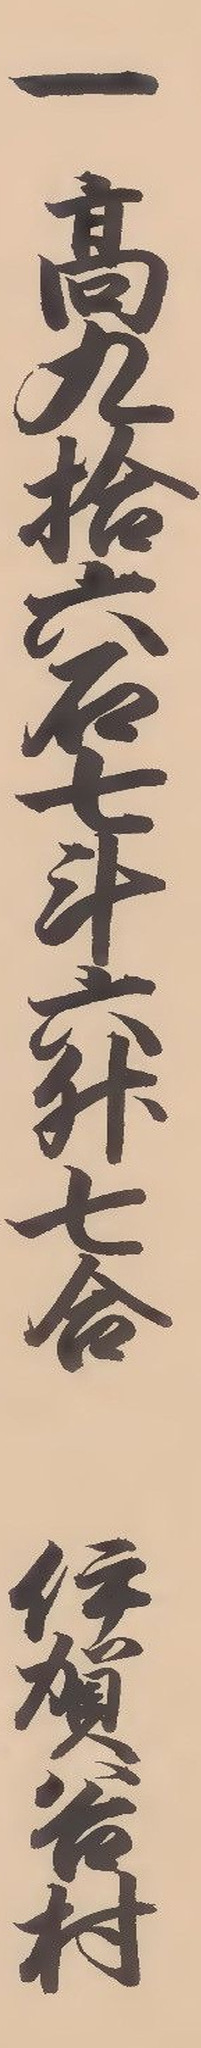一高九拾六石七斗六升七合伊賀谷村
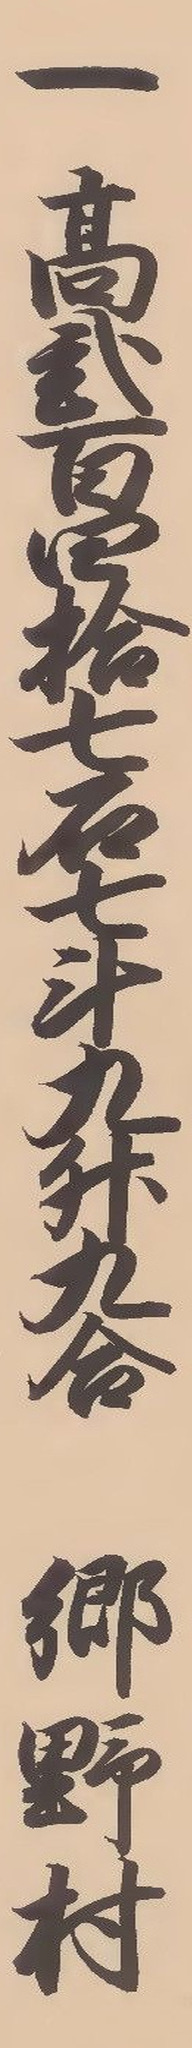一高弐百四拾七石七斗九升九合郷野村
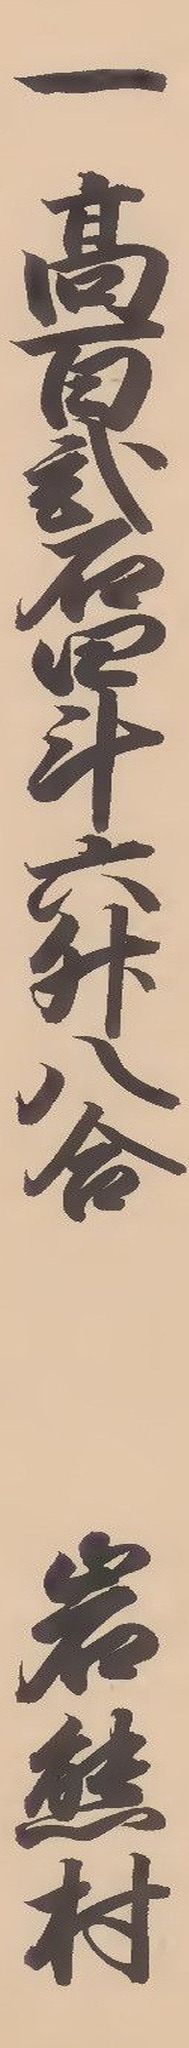一高百弐石四斗六升八合岩熊村

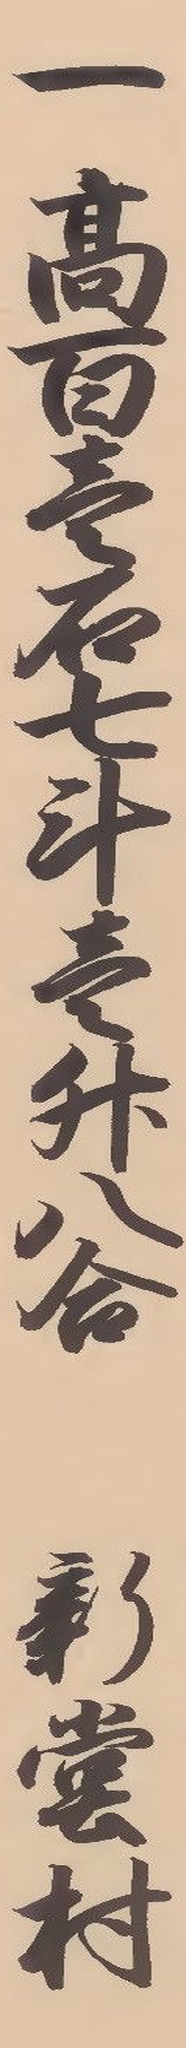一高百壱石七斗壱升八合新堂村
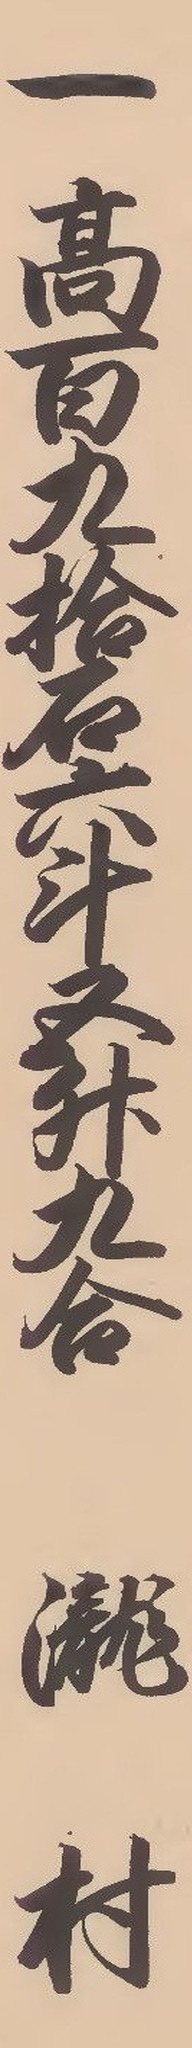一高百九拾石六斗五升九合瀧村
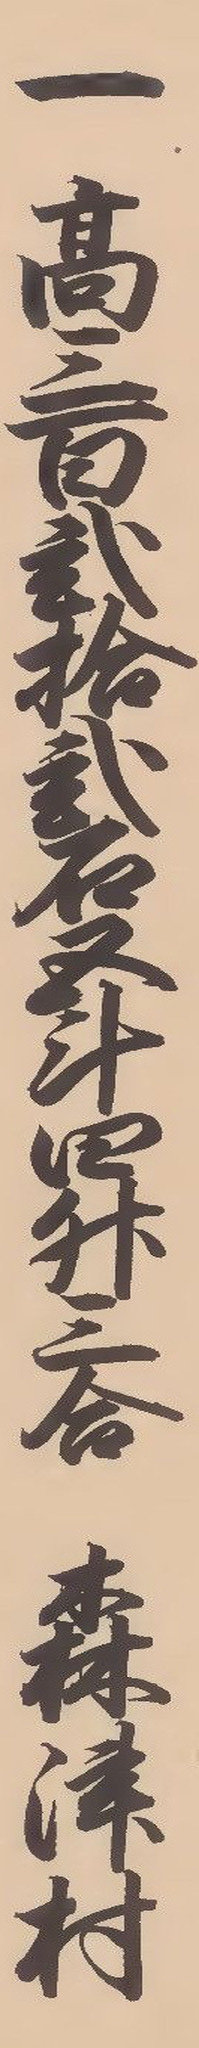一高三百弐拾弐石五斗四升三合森津村
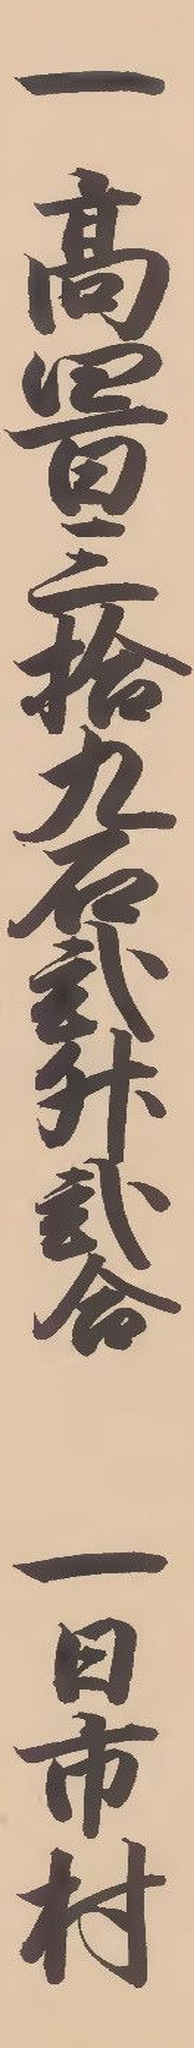一高四百三拾九石弐斗弐合一日市村
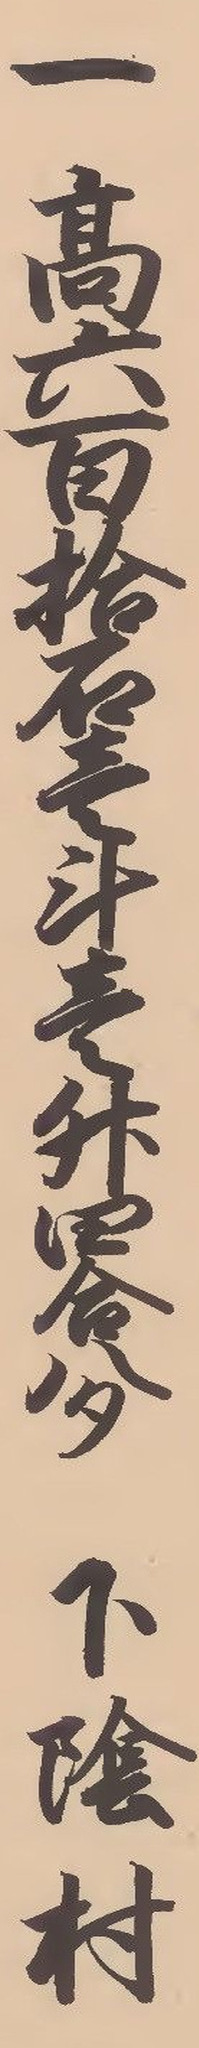一高六百拾石壱斗壱升四合八勺下陰村
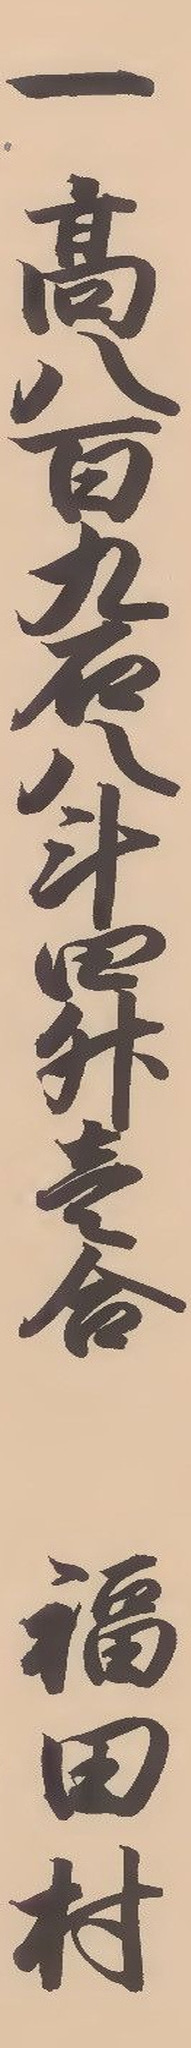一高八百九石八斗四升壱合福田村
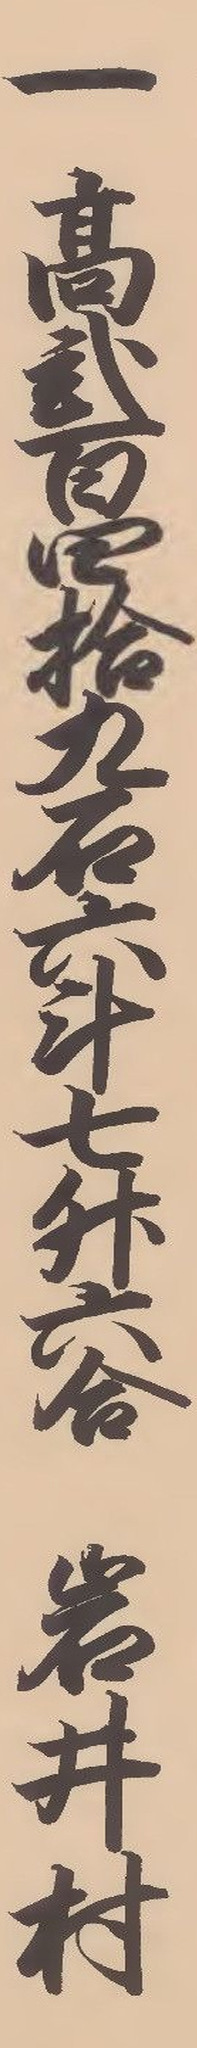一高弐百四拾九石六斗七升六合岩井村
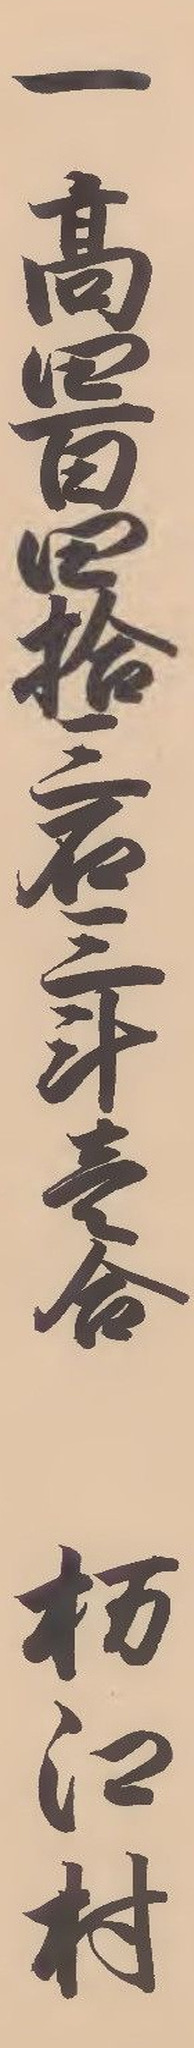一高四百四拾三石三斗壱合栃江村

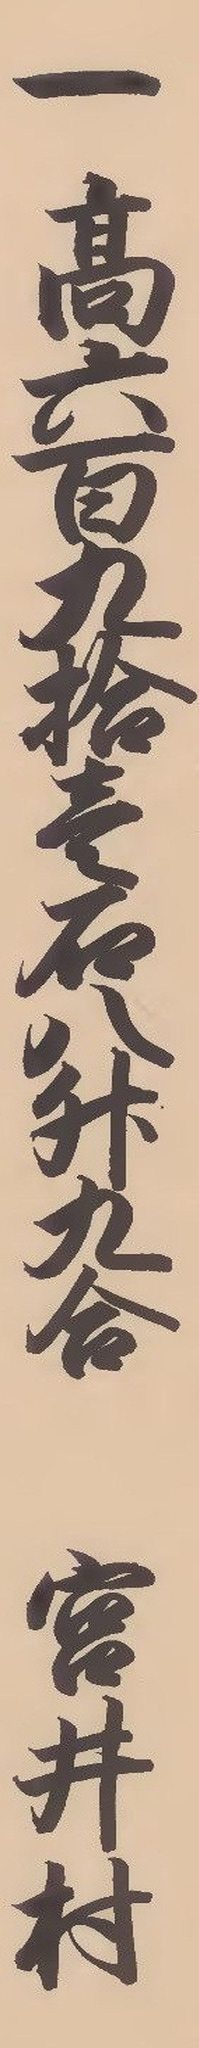一高六百九拾壱石八升九合宮井村
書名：但馬国郷帳
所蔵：国立公文書館 National Archives of Japan
